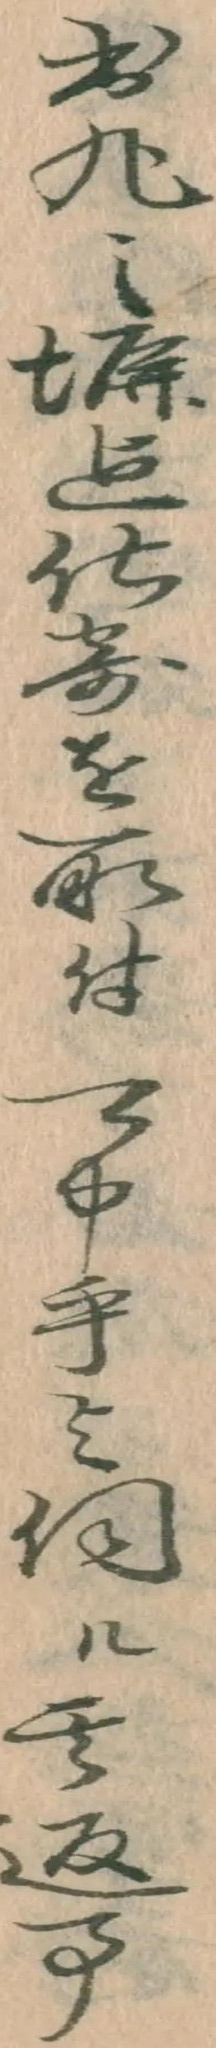出丸之塀迄仕寄を取付可申乎与伺る其返事
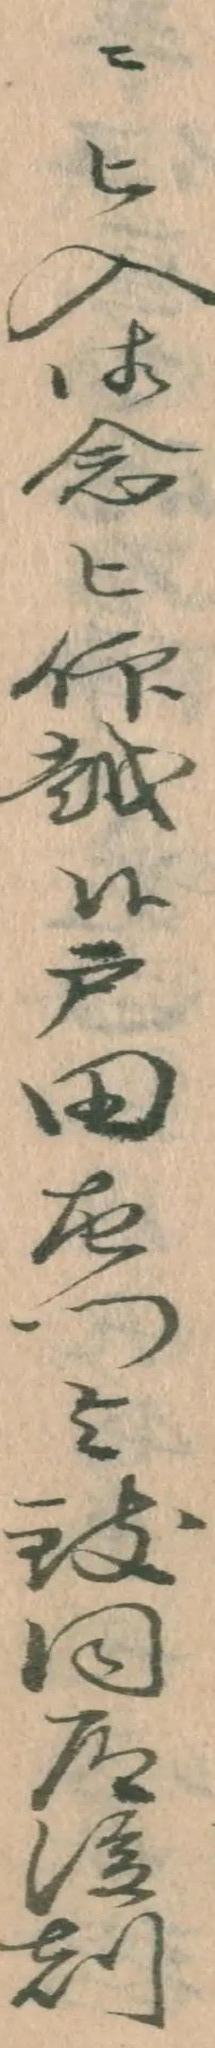に被入御念被仰越候戸田左門与致同道後刻
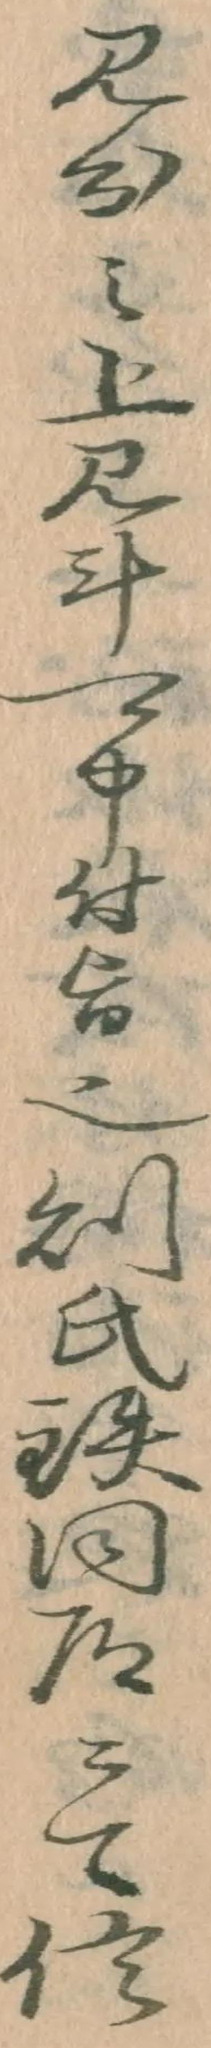見分之上見斗可申付旨也則氏鉄同道にて信
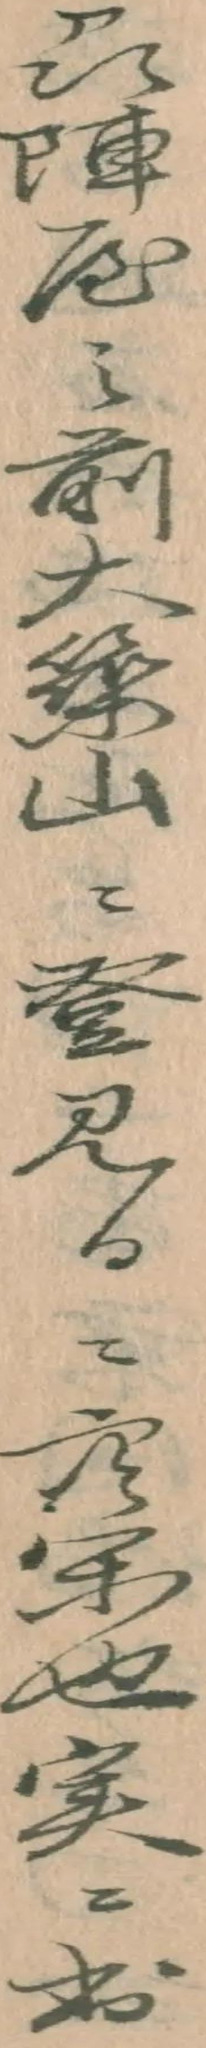州陣屋之前大築山に登見るに空閑也実に出
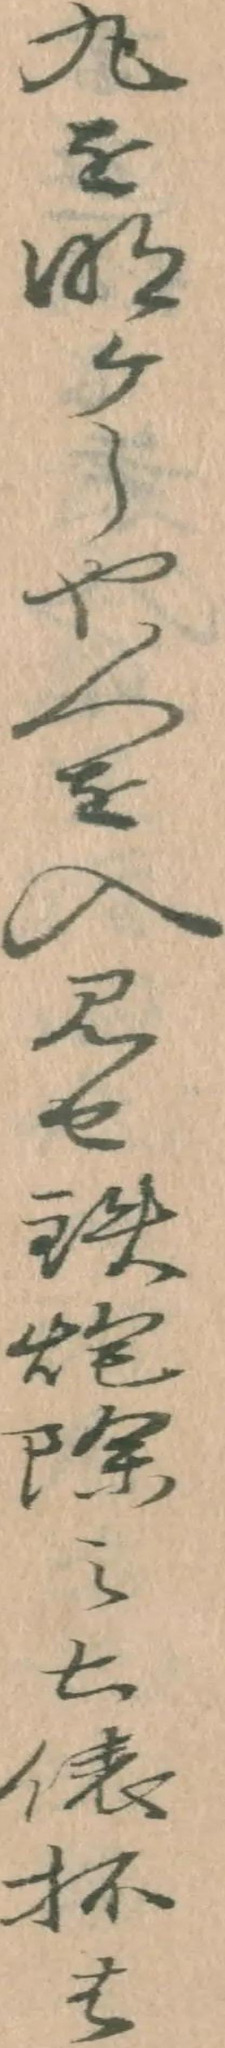丸を明けしや人を入見せ鉄砲除之土俵抔者
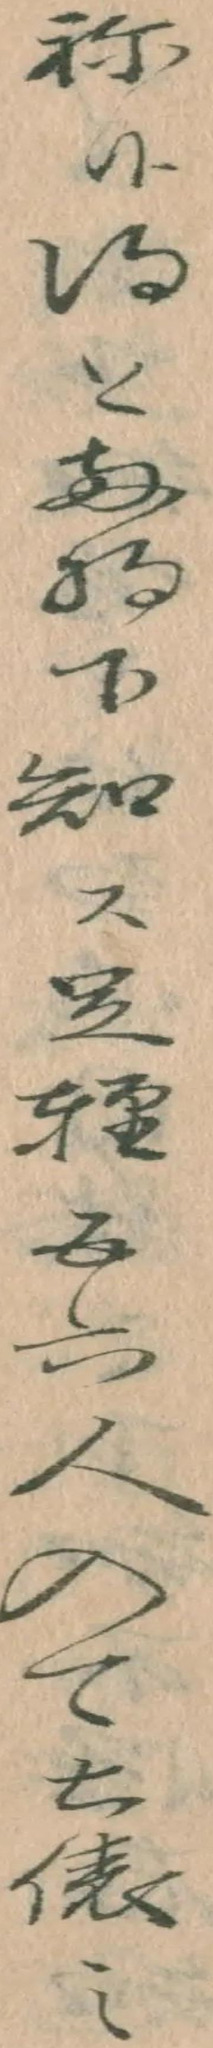祢候得と両将下知す足軽五六人入て土俵之
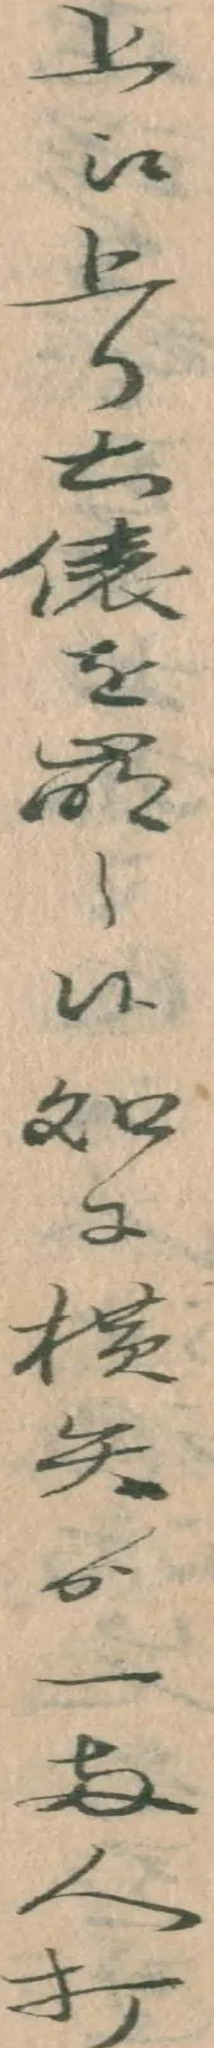上江上り土俵を崩し候処尓横矢ゟ一両人打
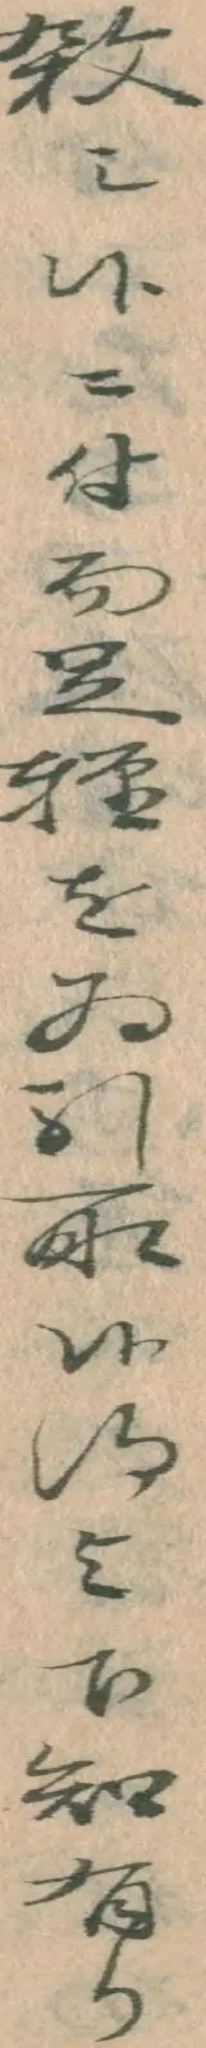殺し候に付而足軽をゐ引取候得与下知有り
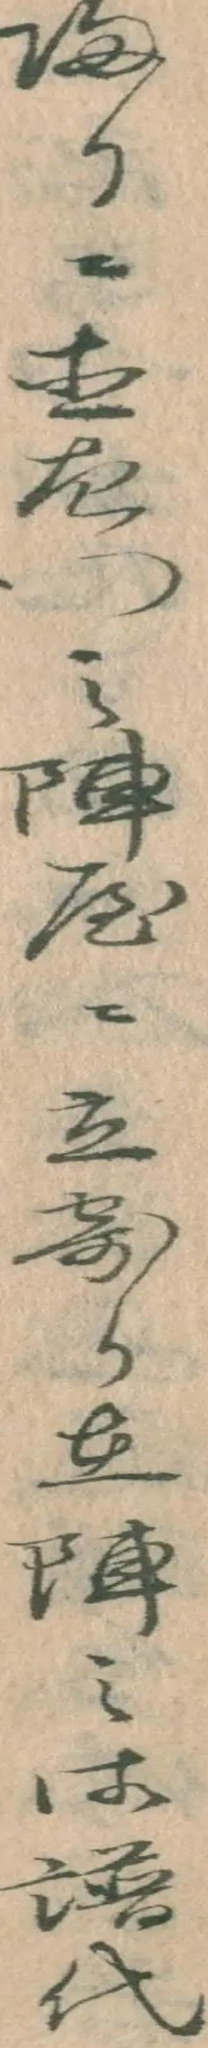帰りに直左門之陣屋に立寄り在陣之御譜代
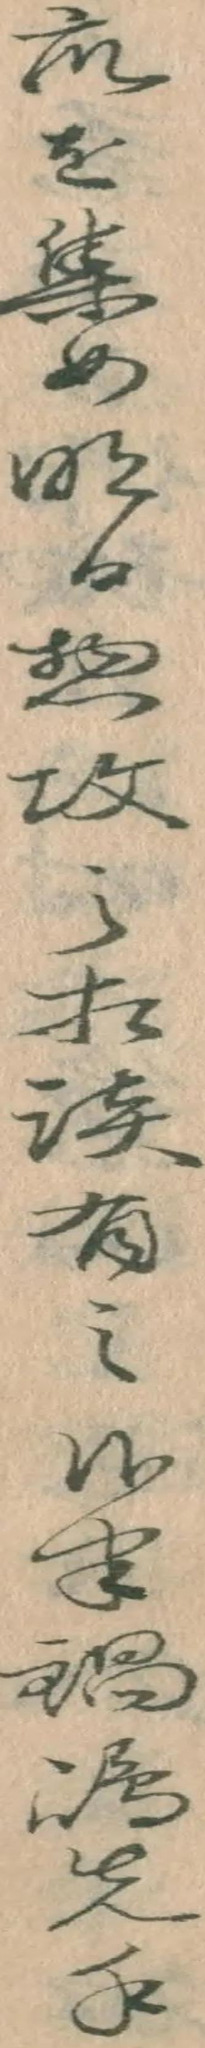衆を集め明日惣攻之相談有之候半鍋島先手
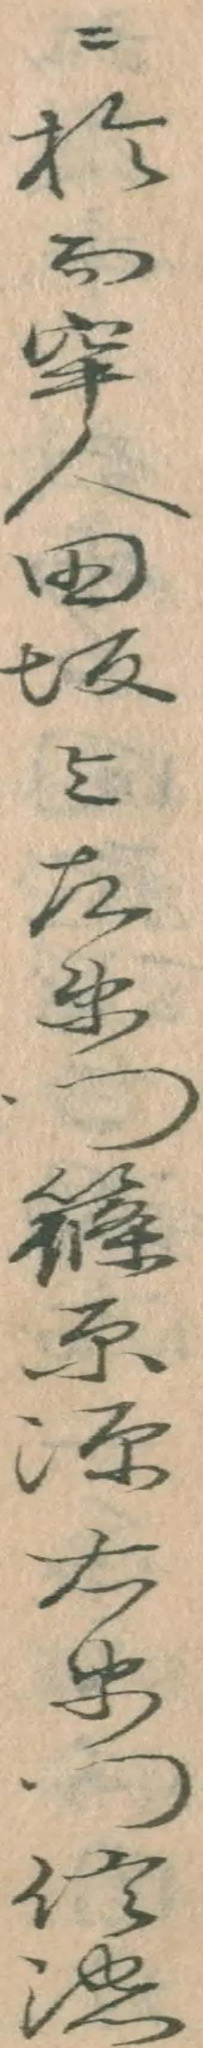に於而牢人田坂与左衛門篠原源右衛門信濃
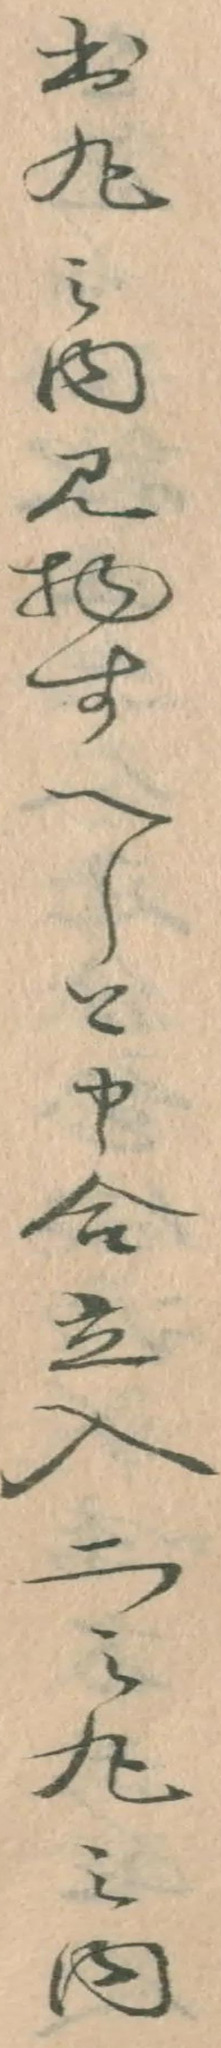出丸之内見物すへしと申合立入二之丸之内

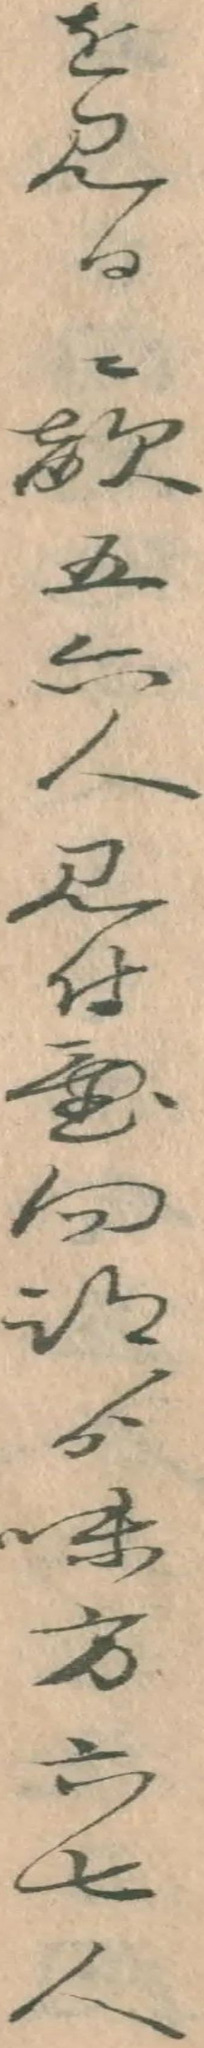を見るに敵五六人見付置向跡ゟ味方六七人
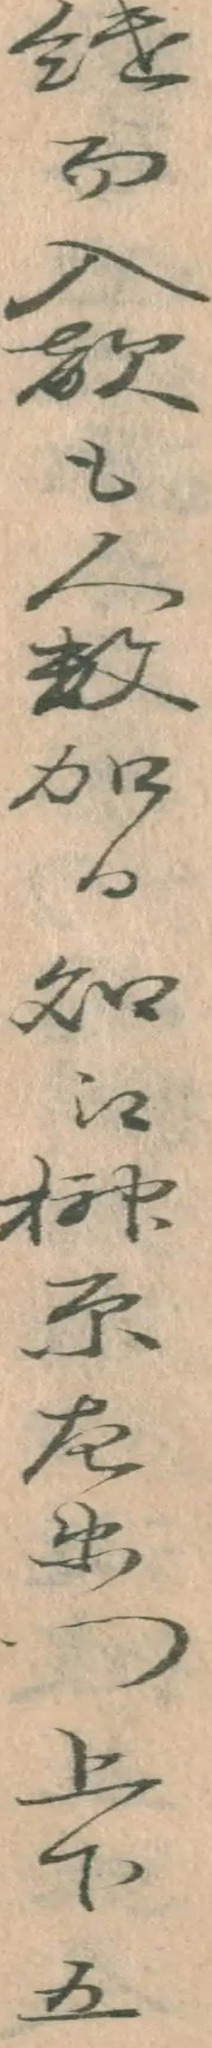鑓而入敵も人数加る処江榊原左衛門上下五
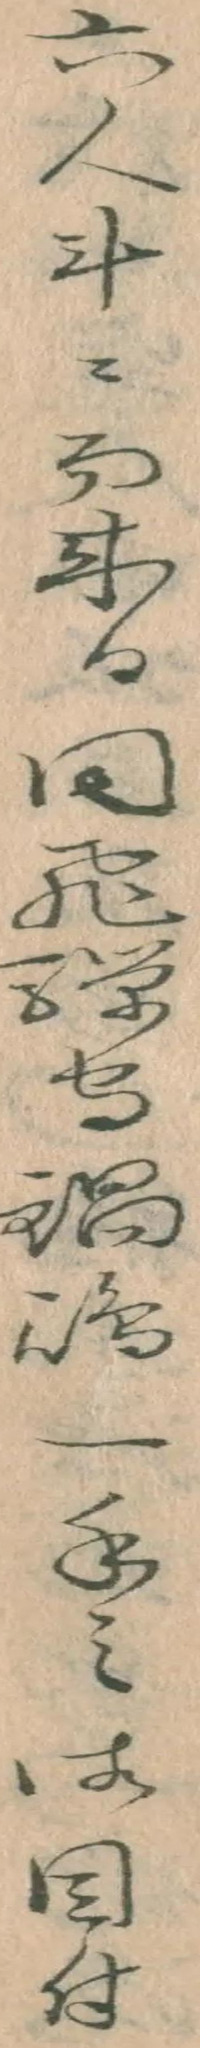六人斗に而来る同飛騨守鍋島一手之御目付
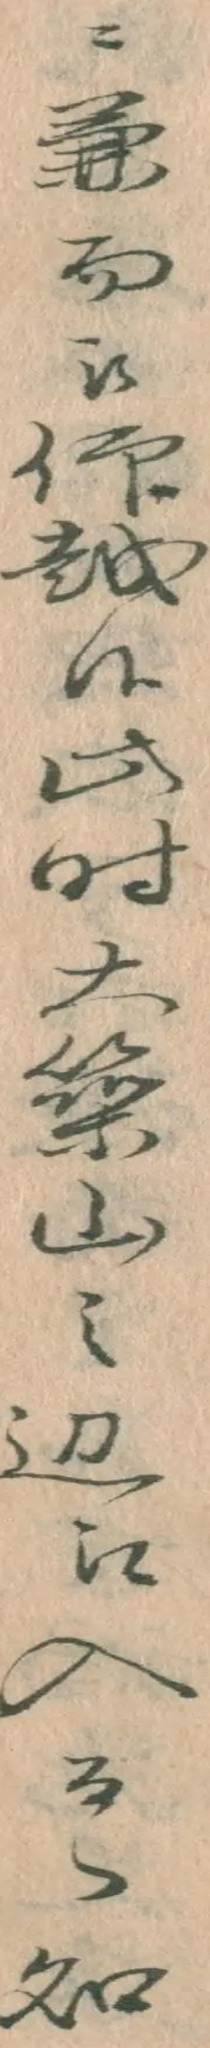に兼而被仰越候此時大築山之辺江入るゝ処
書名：切支丹御退治記 49巻. [8]
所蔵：国立国会図書館 National Diet Library, JAPAN
